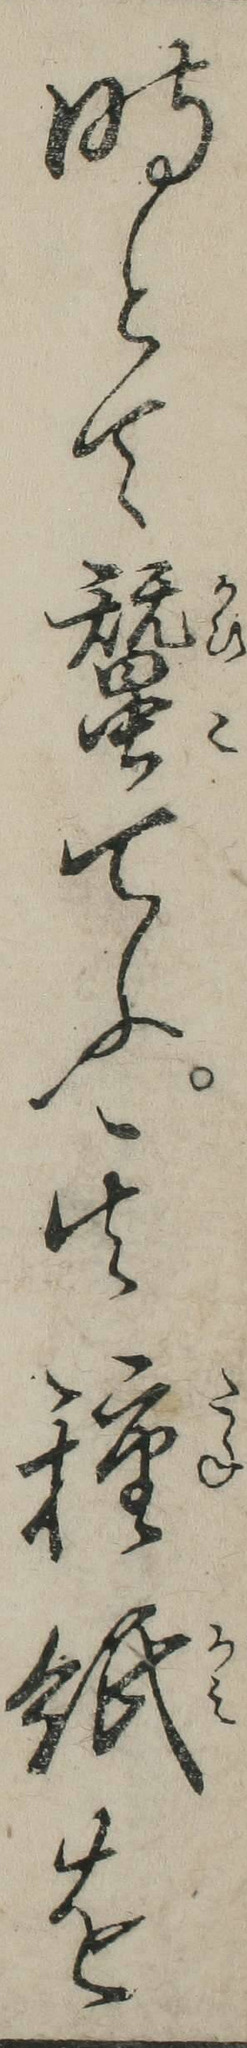時とて蚕てふ。其種紙を
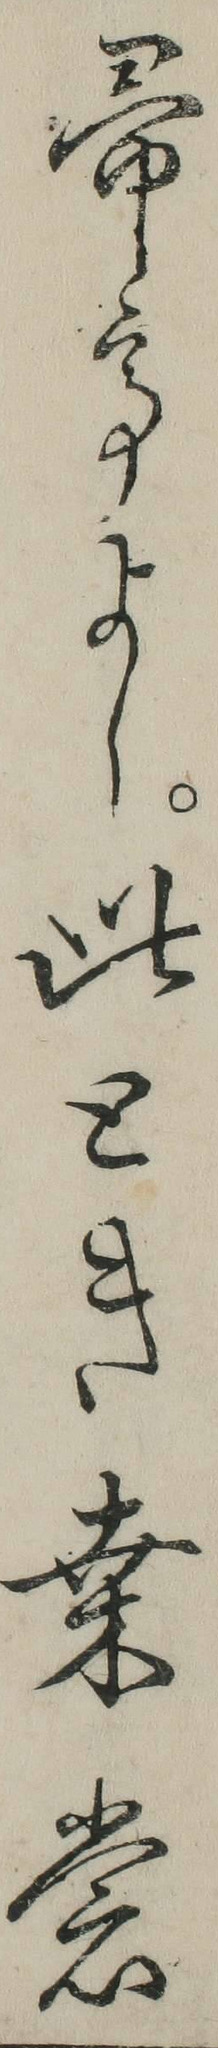帚てよし。此とき桑も
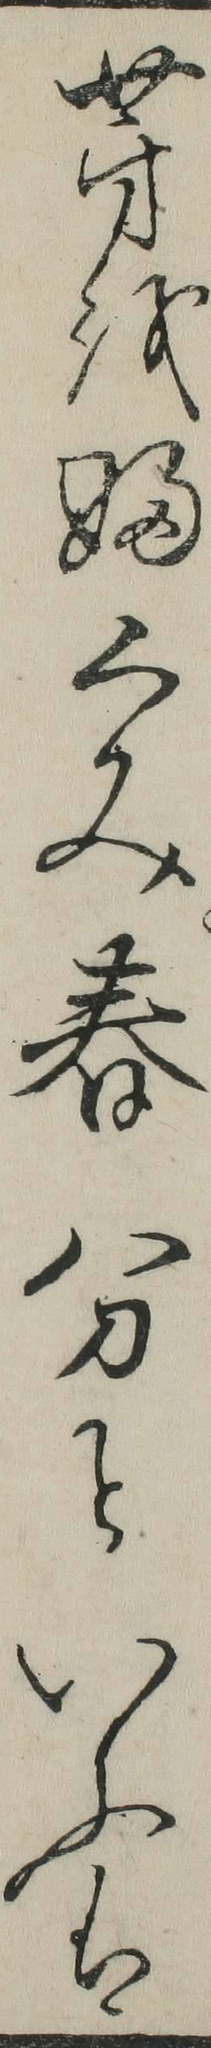芽をふくみ。春分といふは
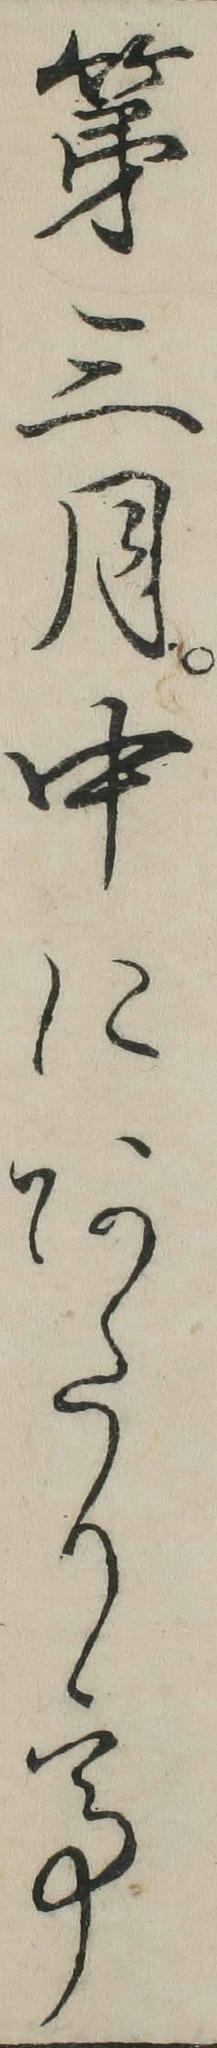第三月。中にあたりて
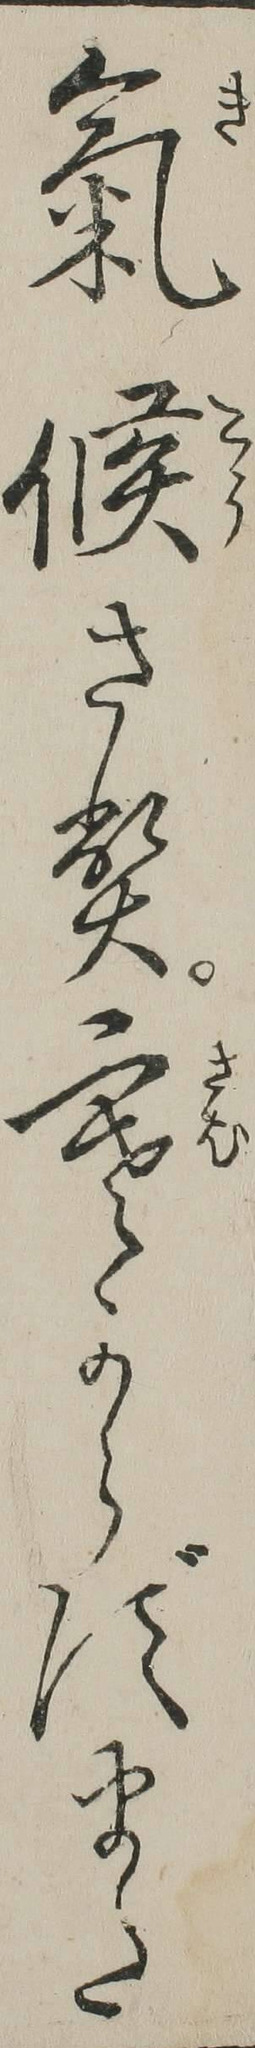気候さへ。寒からずまた
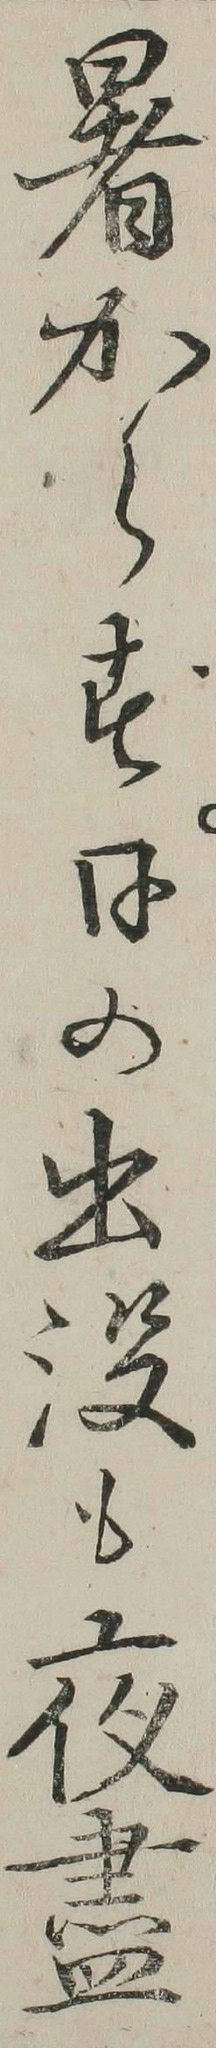暑からず。日の出没も夜昼
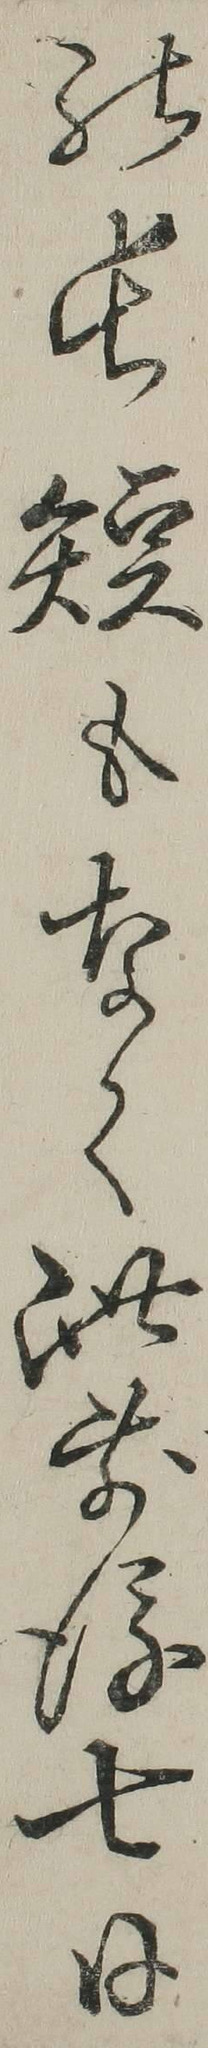の長短もなく此前後七日
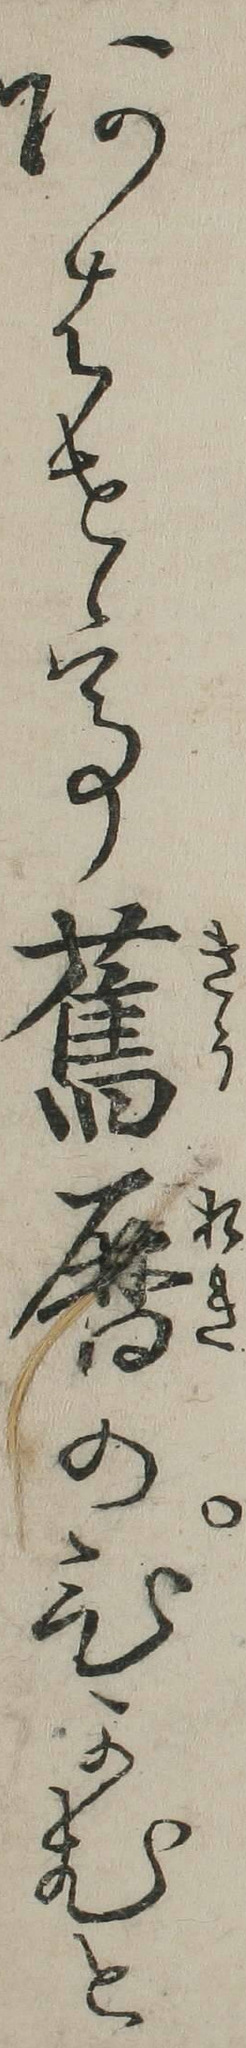あはせて旧暦の。ひかむと

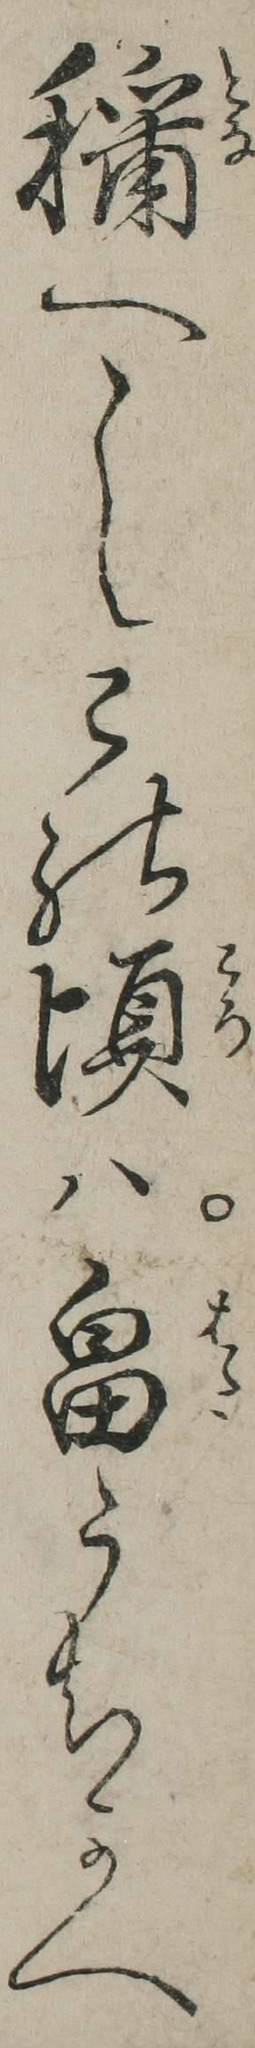称へしこの頃は。畑うちかへ
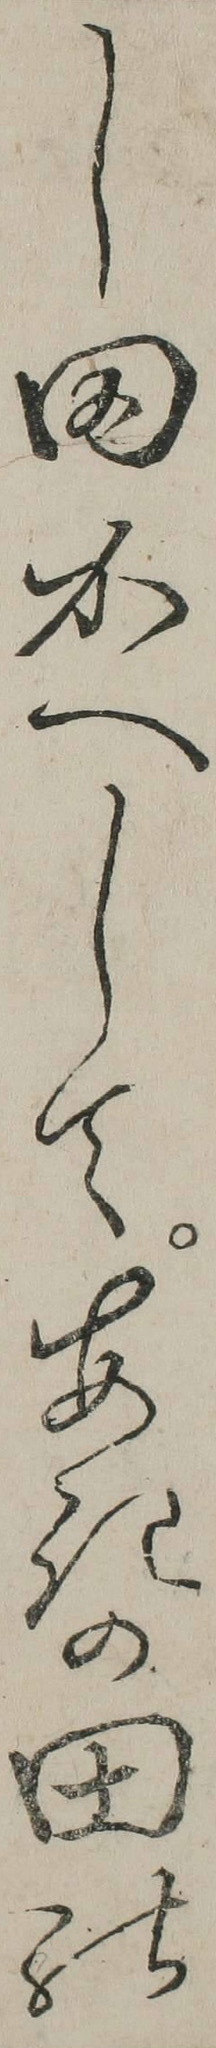し田かへして。あきの田の
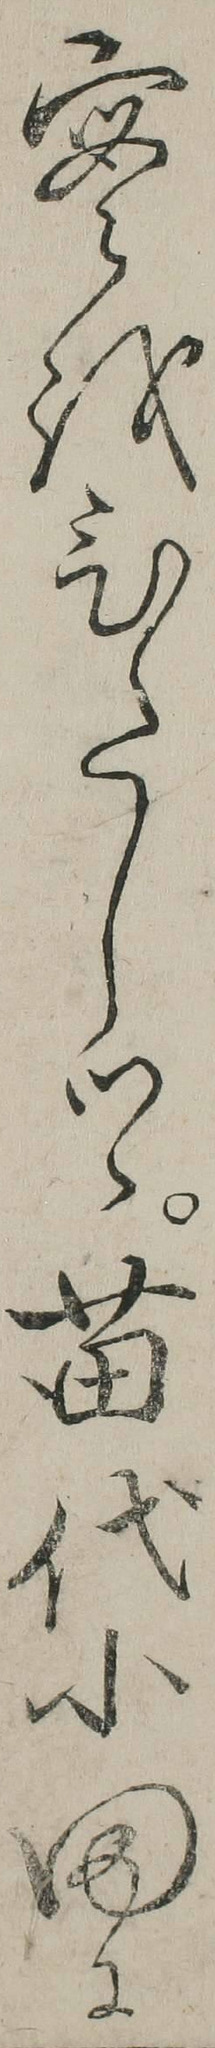実をひたしつゝ。苗代小田に
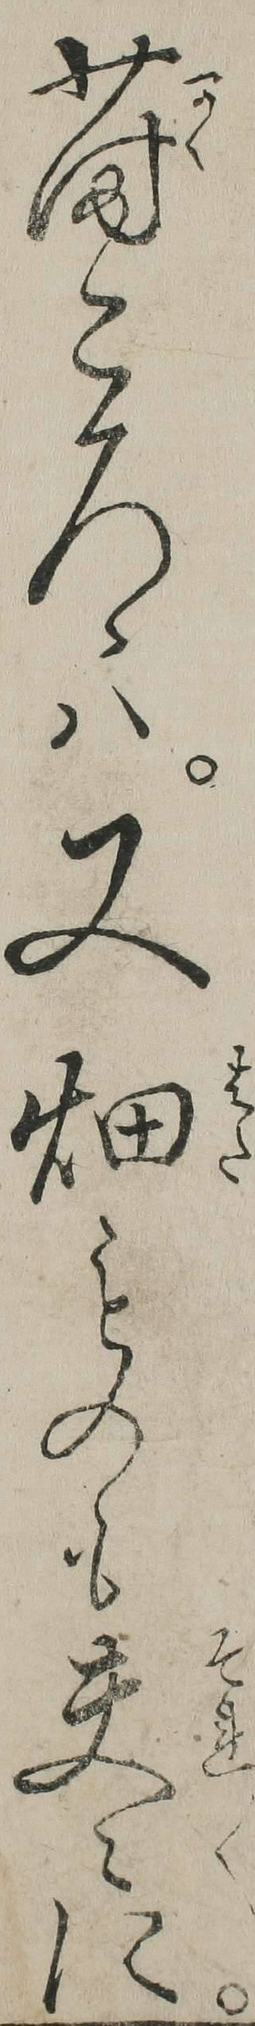蒔ころは。又畑ものも夫々に。
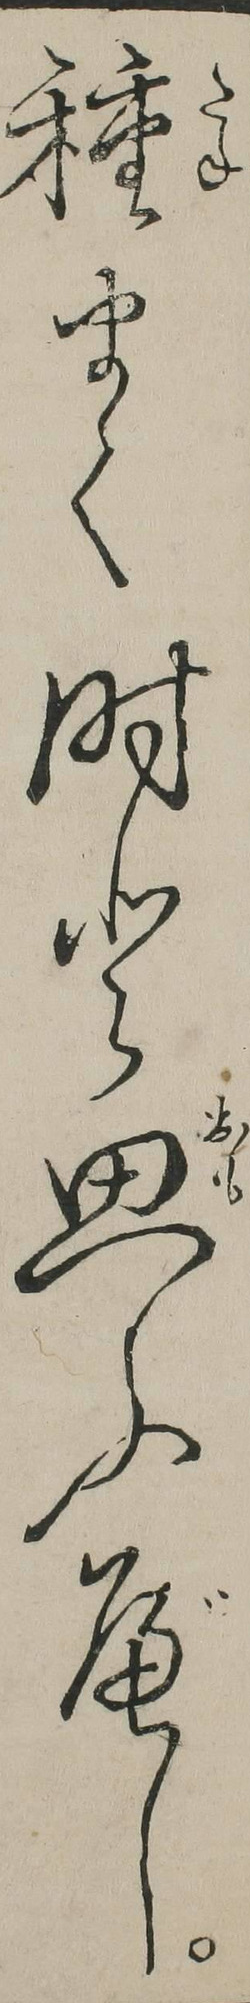種まく時と思ふべし。
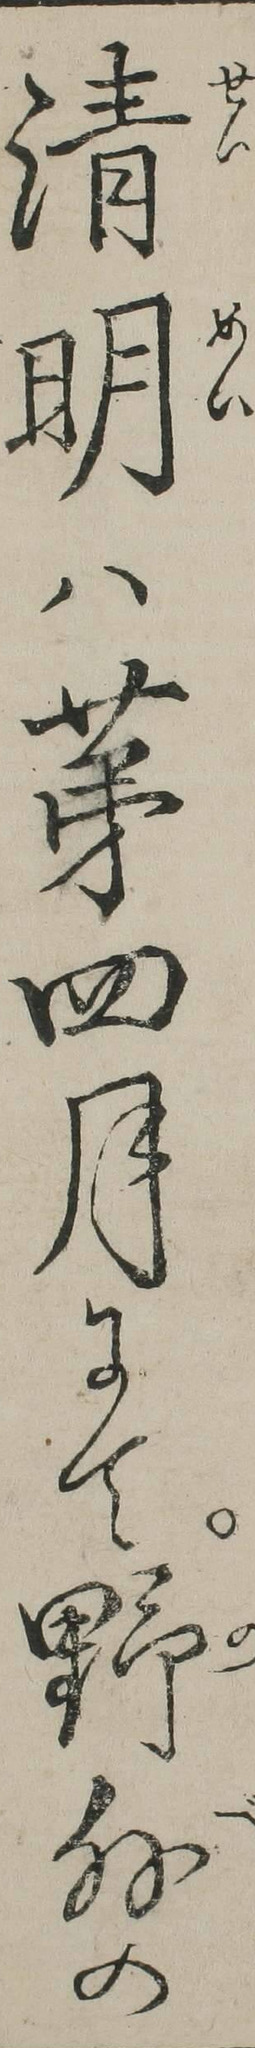清明は第四月にて。野外の
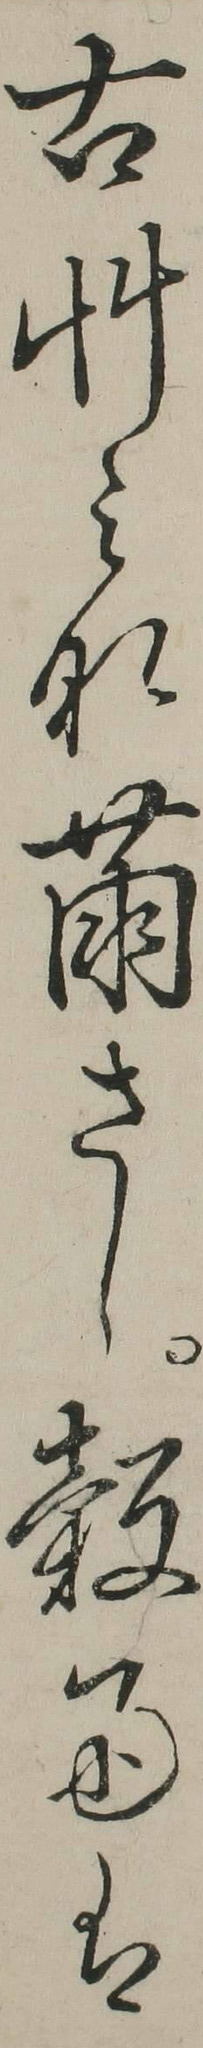古草みな萌さし。穀雨は
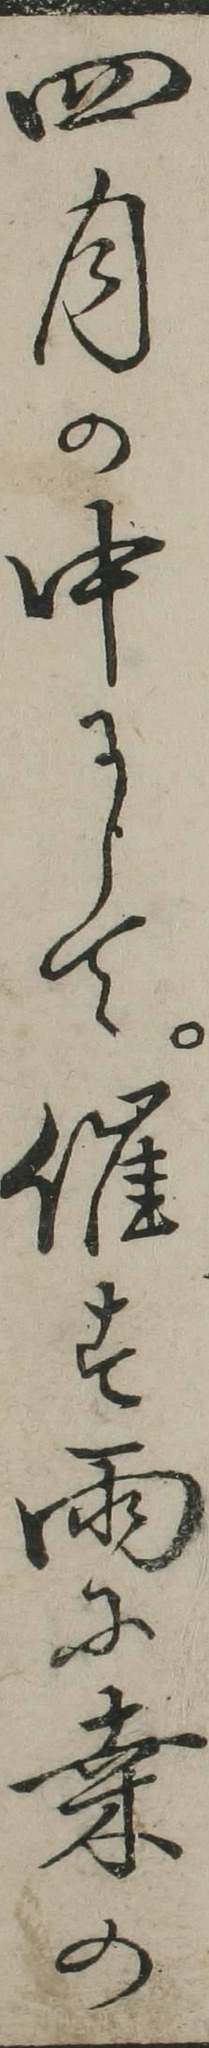四月の中にて。催す雨に桑の
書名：農蠶必要日読往来
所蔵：東京学芸大学附属図書館 国文学研究資料館
